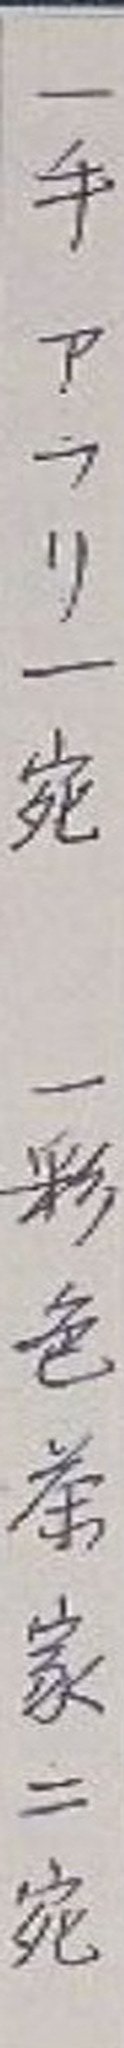一手あふり一宛一彩色茶家二宛
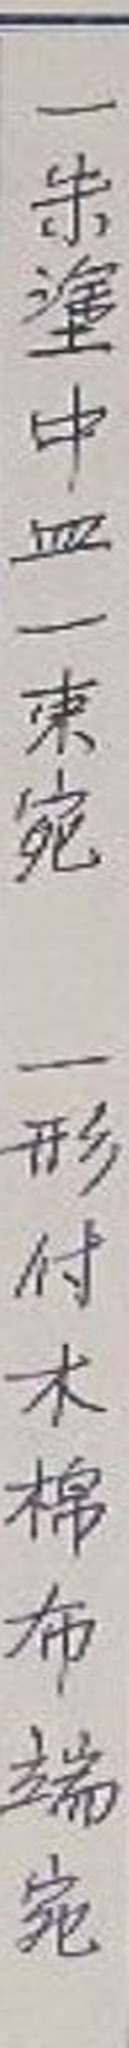一朱塗中皿一束宛一形付木棉布端宛
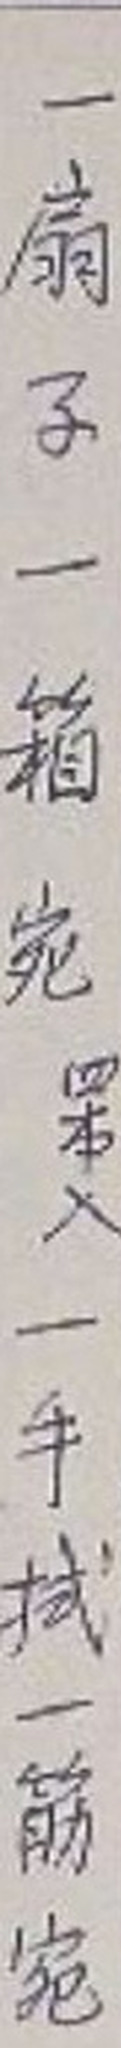一扇子一箱宛四本入一手拭一筋宛
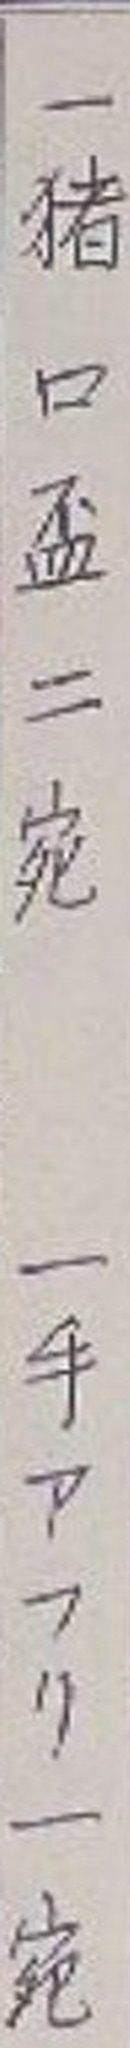一猪口盃二宛一手あふり一宛
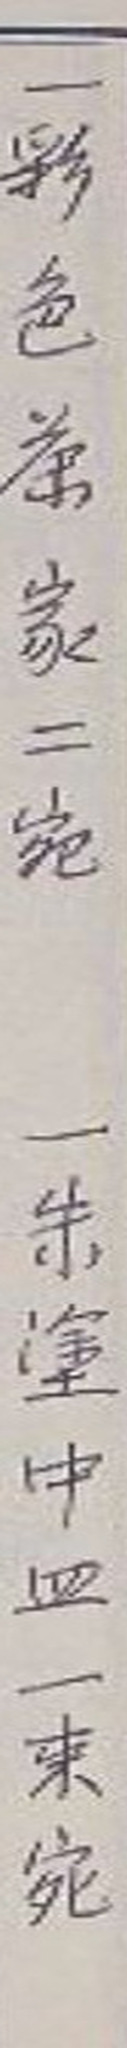一彩色茶家二宛一朱塗中皿一束宛
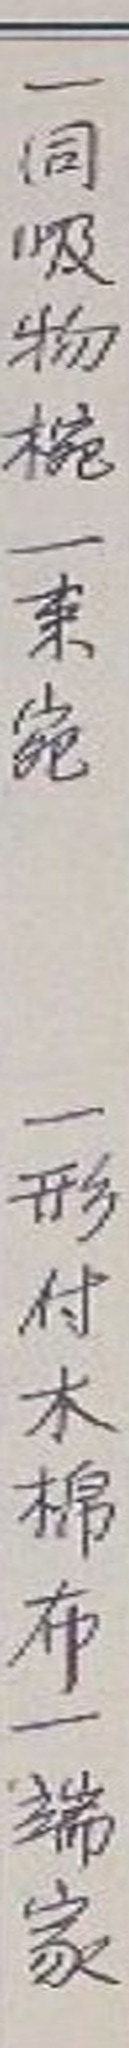一同吸物椀一束宛一形付木棉布一端宛
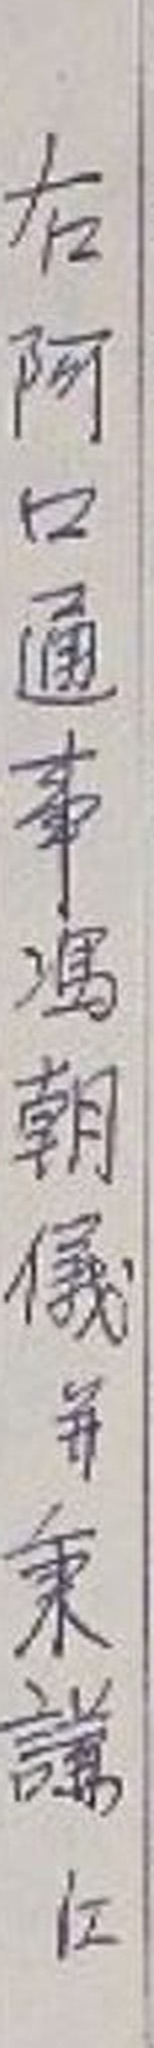右阿口通事馮朝儀并秉謙え
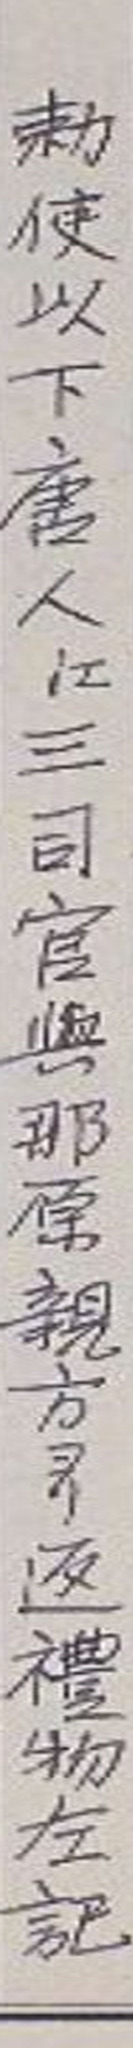勅使以下唐人え三司官与那原親方より返礼物左記
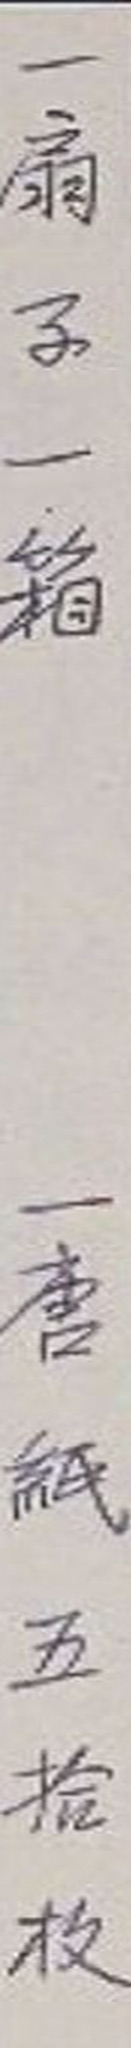一扇子一箱一唐紙五拾枚
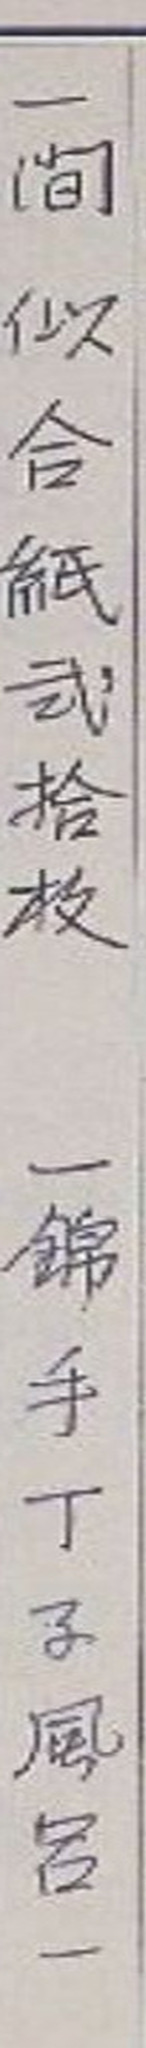一間似合紙弐拾枚一錦手丁子風呂一
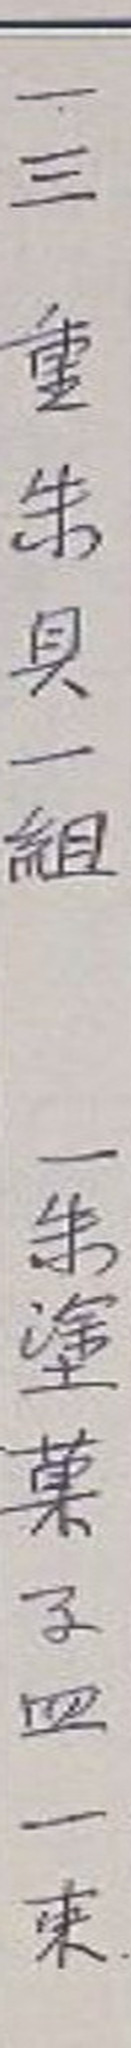一三重朱具一組一朱塗菓子皿一束
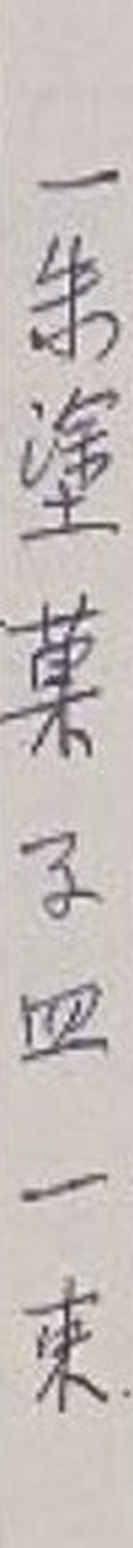一三重朱具一組一朱塗菓子皿一束
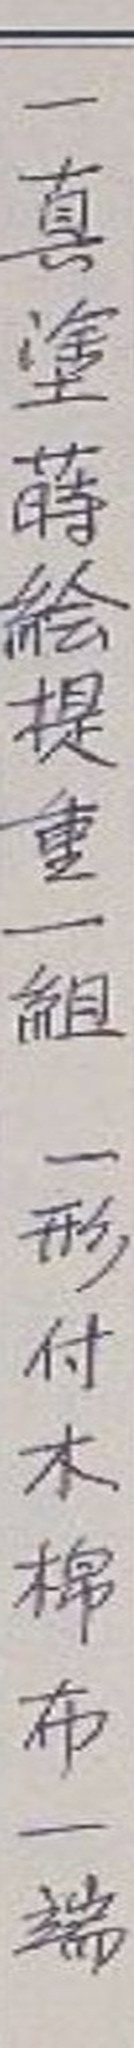一真塗蒔絵提重一組一形付木棉布一端
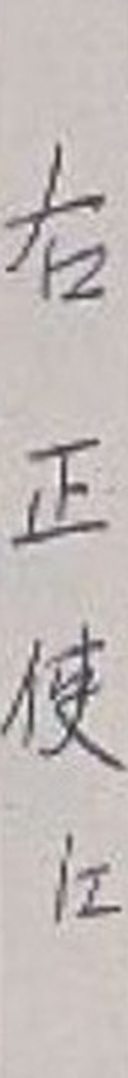右正使え
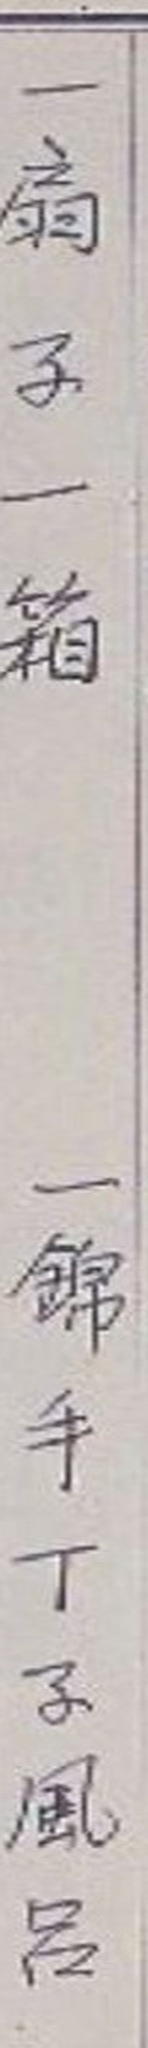一扇子一箱一錦手丁子風呂
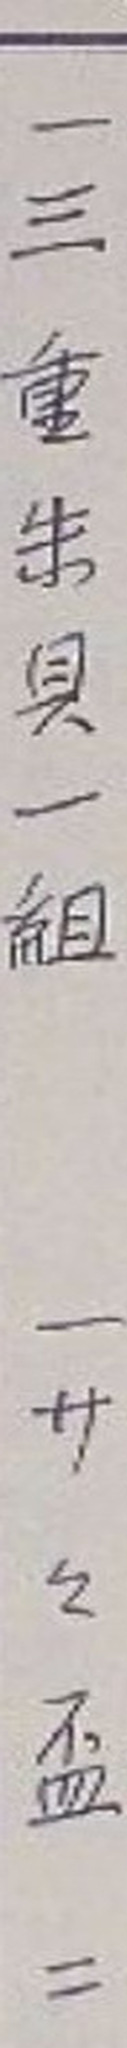一三重朱具一組一サ々盃二
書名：支那冊封使来琉諸記 下巻
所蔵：University of the Ryukyus Library
